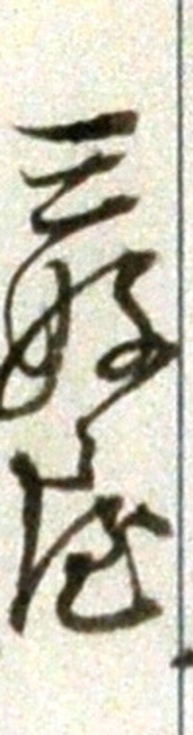三好屋
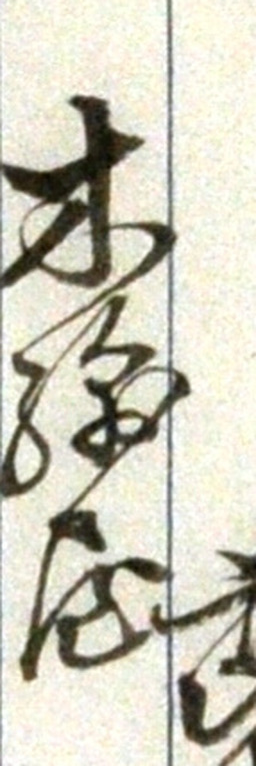木綿屋
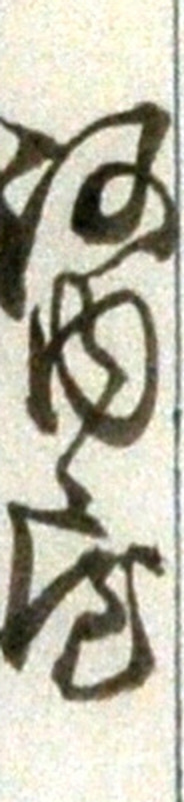河内屋
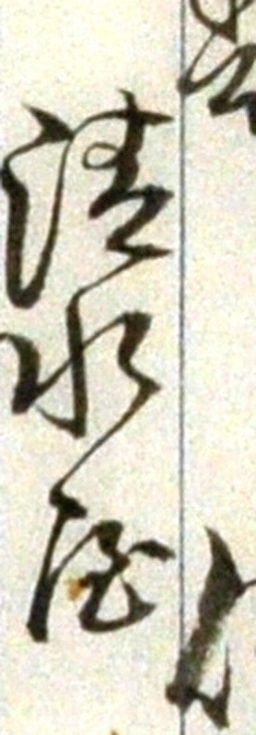清水屋
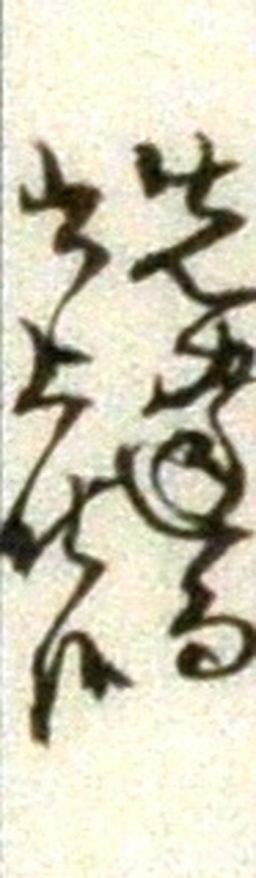書上仕候
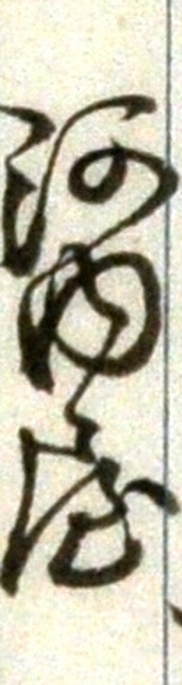河内屋
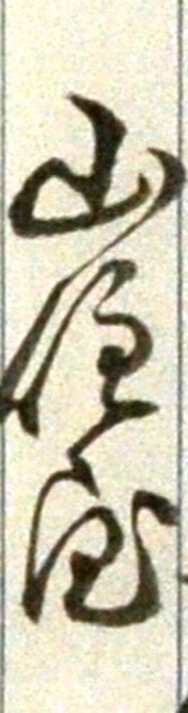山住屋
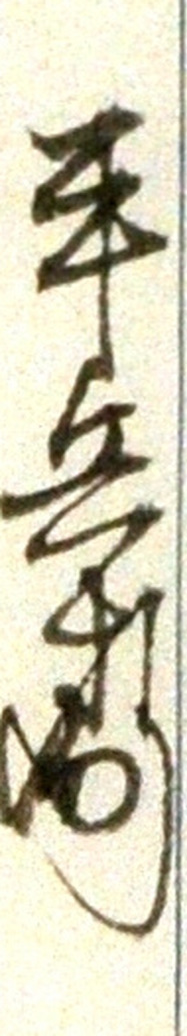平兵衛
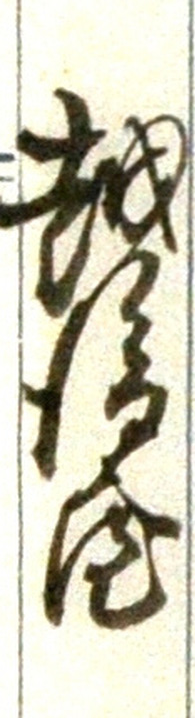越後屋

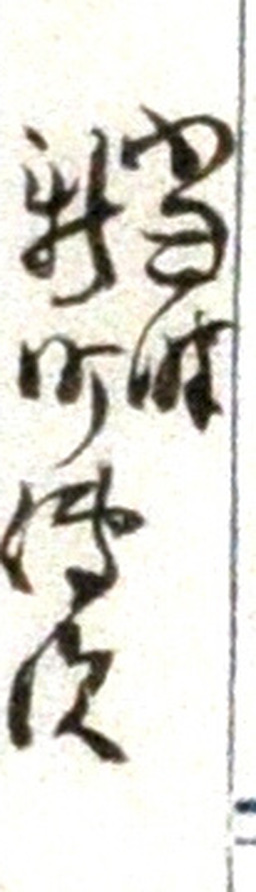新町伝治
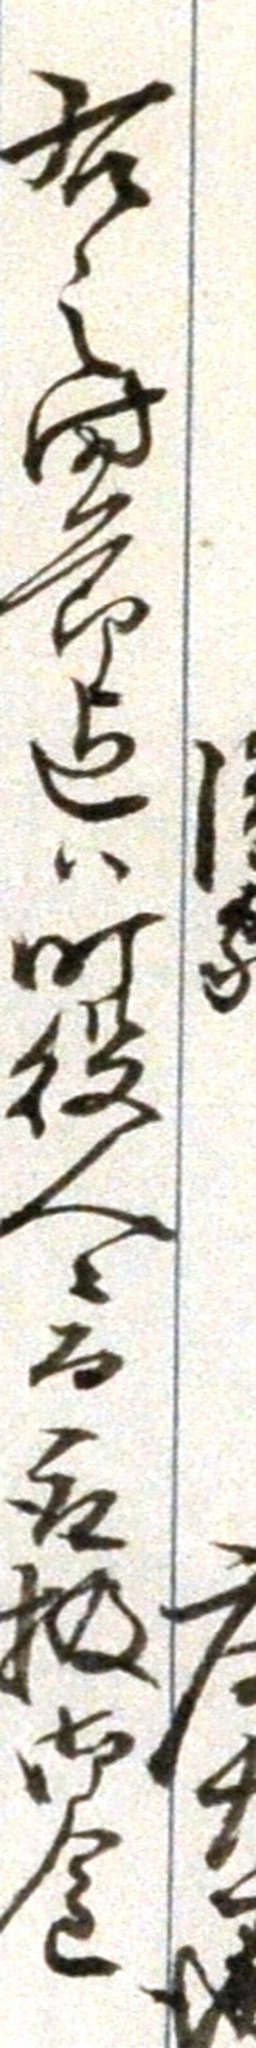右之時節迄ハ町役人ニ而取扱御金
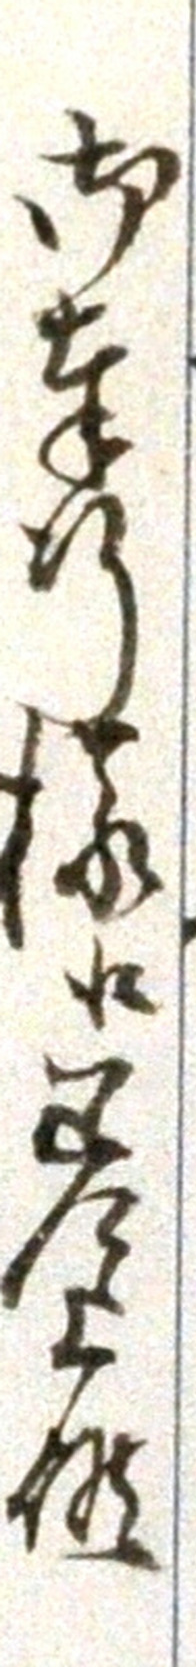御奉行様江差上候
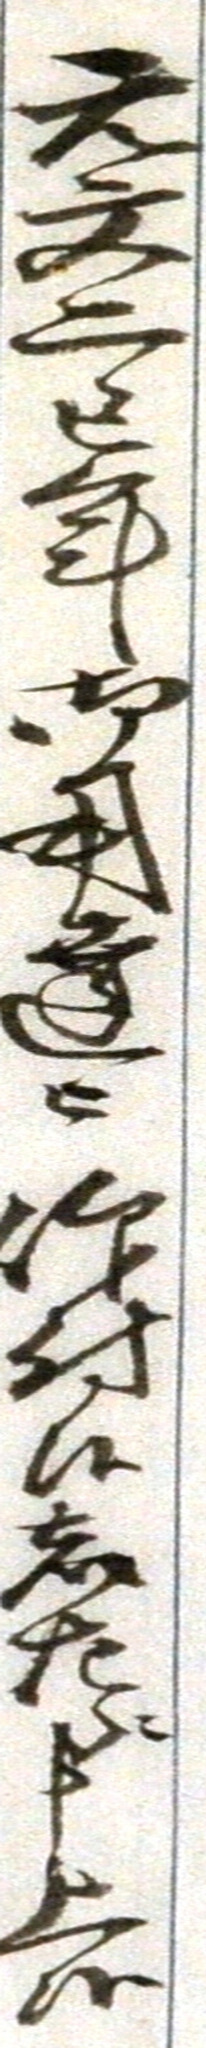元文二巳年御用達被仰付候者左ニ申上候
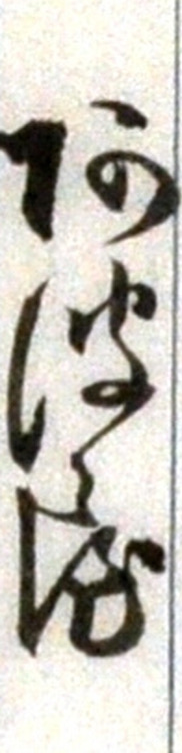阿波屋
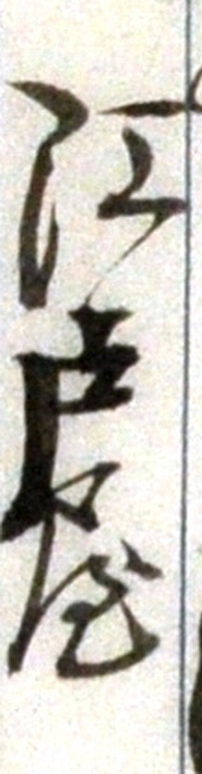江戸屋
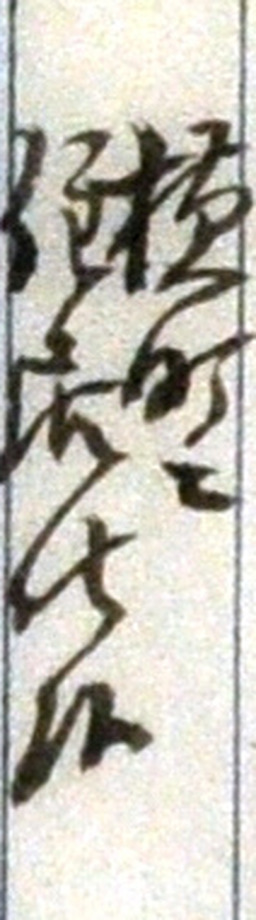住居仕候
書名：御拝地以来御用達相勤候者名前
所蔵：伊那市立高遠町図書館・合同会社AMANE
